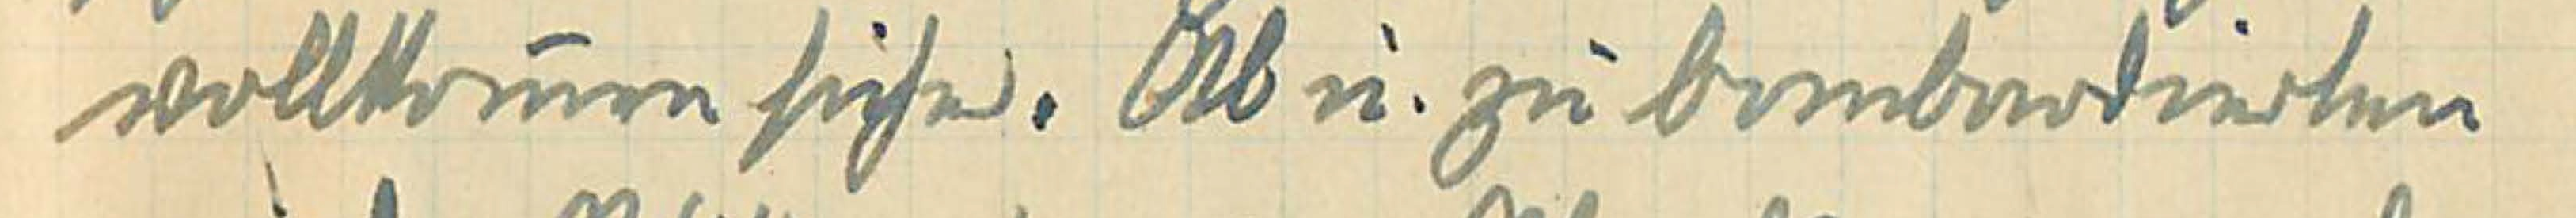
vollkommen sicher. Ab u. zu bombardierten
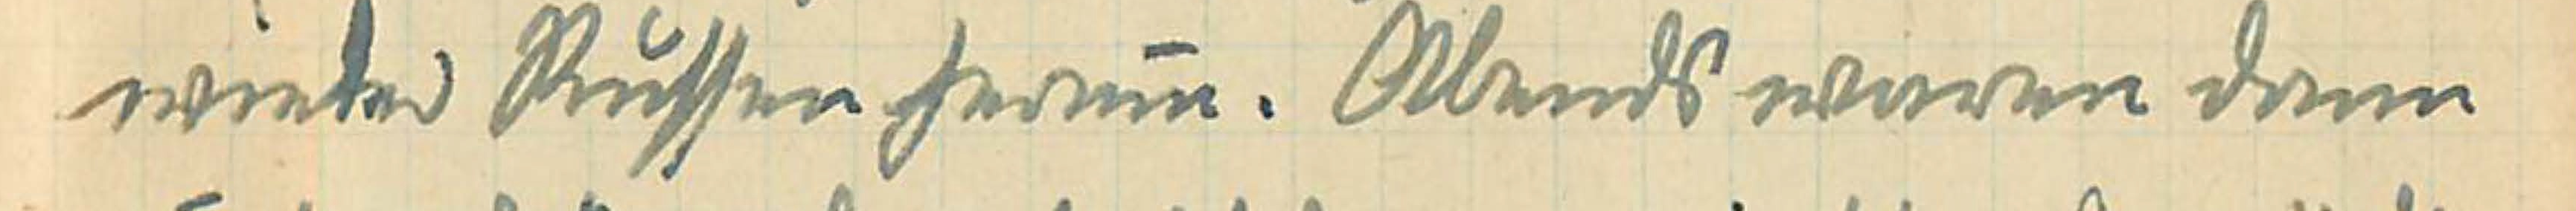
wieder Russen herum. Abends waren dann
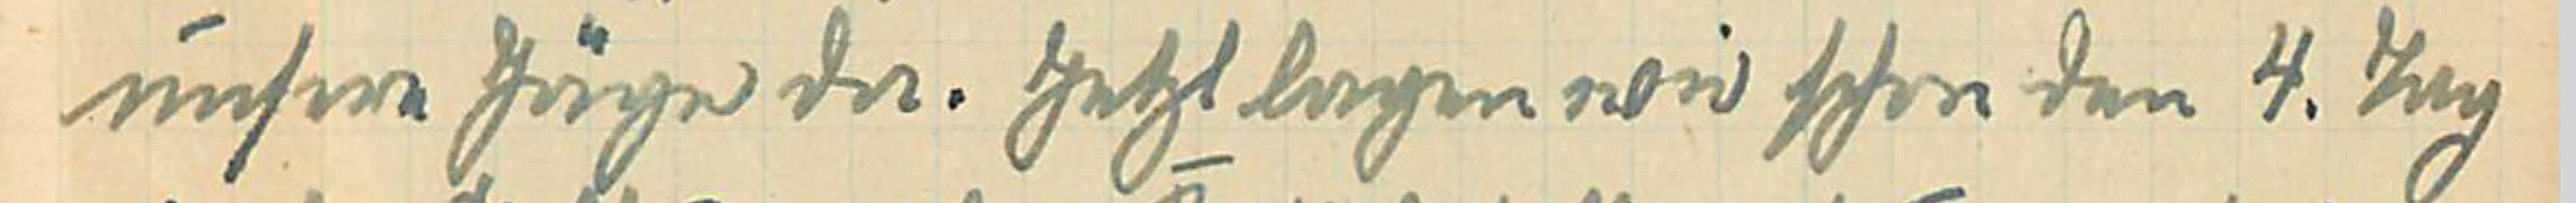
unsere Jäger da. Jetzt lagen wir schon den 4. Tag
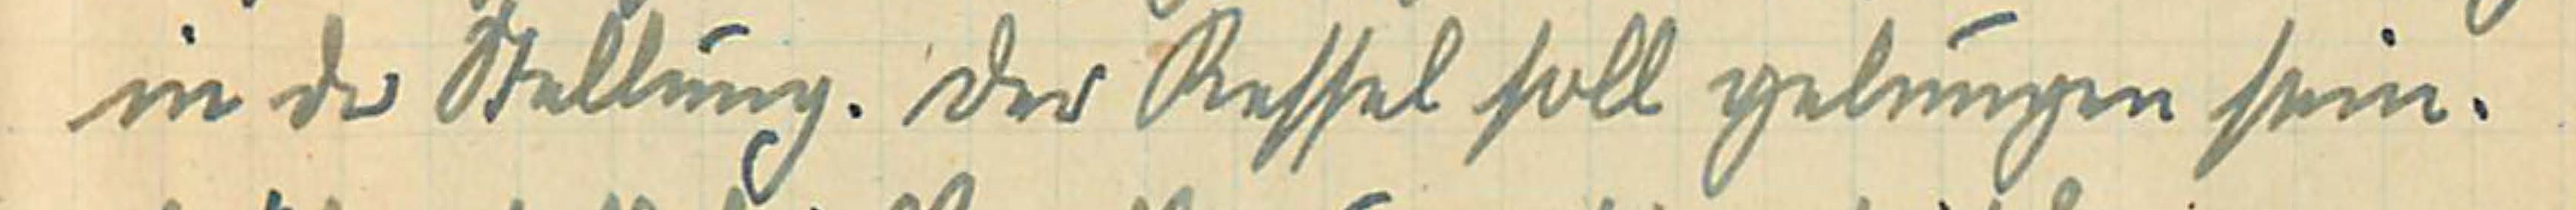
in der Stellung. Der Kessel soll gelungen sein.
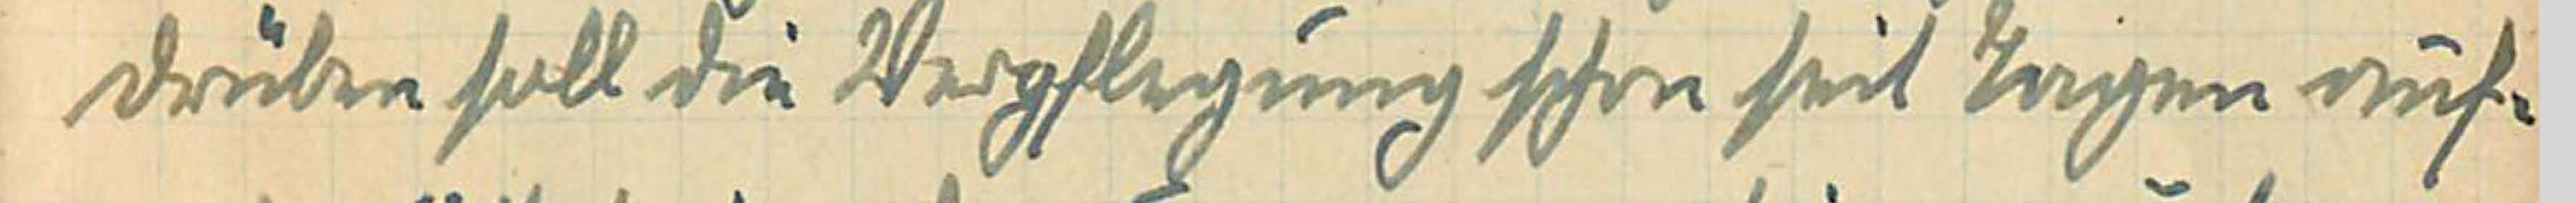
Drüben soll die Verpflegung schon seit Tagen auf-
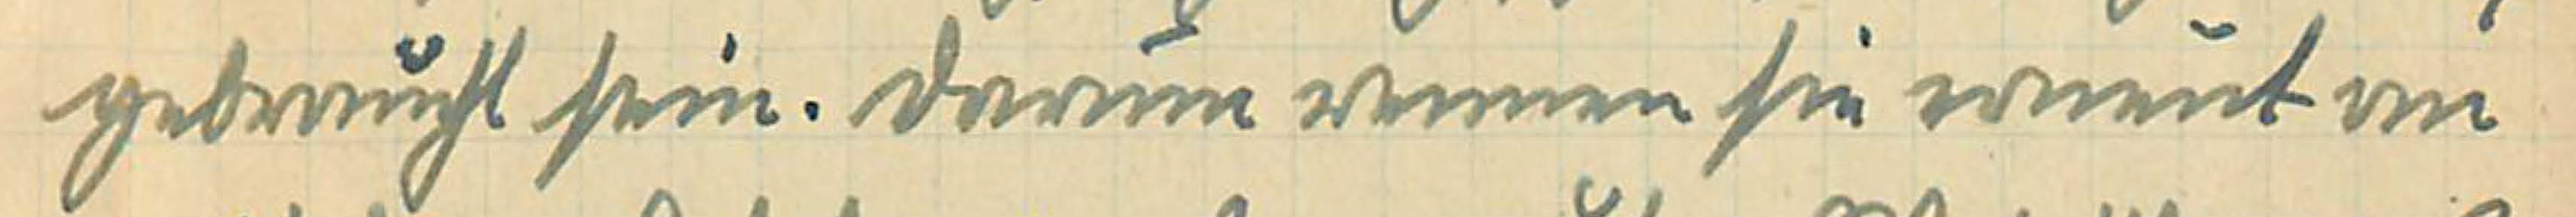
gebraucht sein. Darum rennen sie erneut an
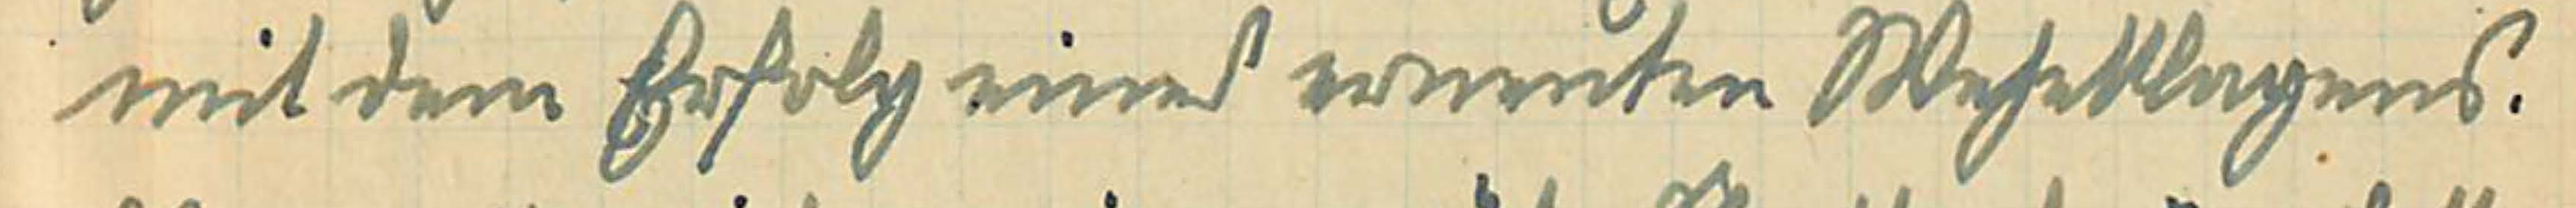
mit dem Erfolg eines erneuten Weheklagens.
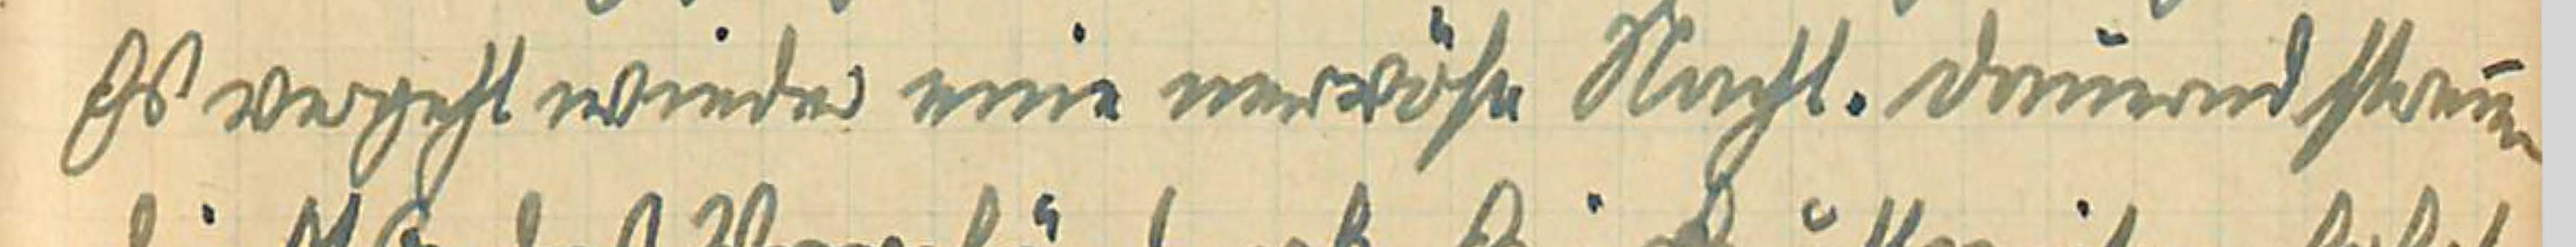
Es vergeht wieder eine nervöse Nacht. Dauernd streuen
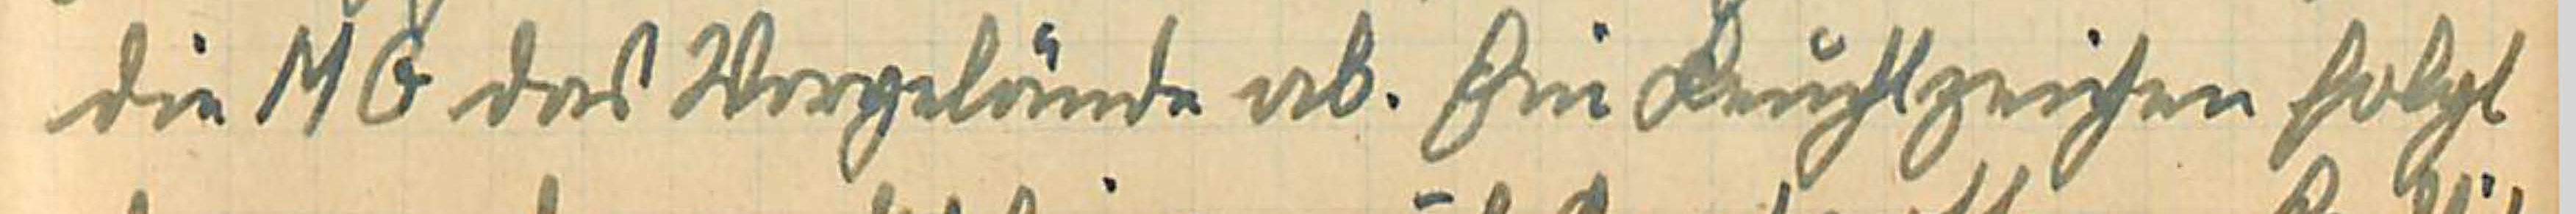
die MG das Vorgelände ab. Ein Leuchtzeichen folgt
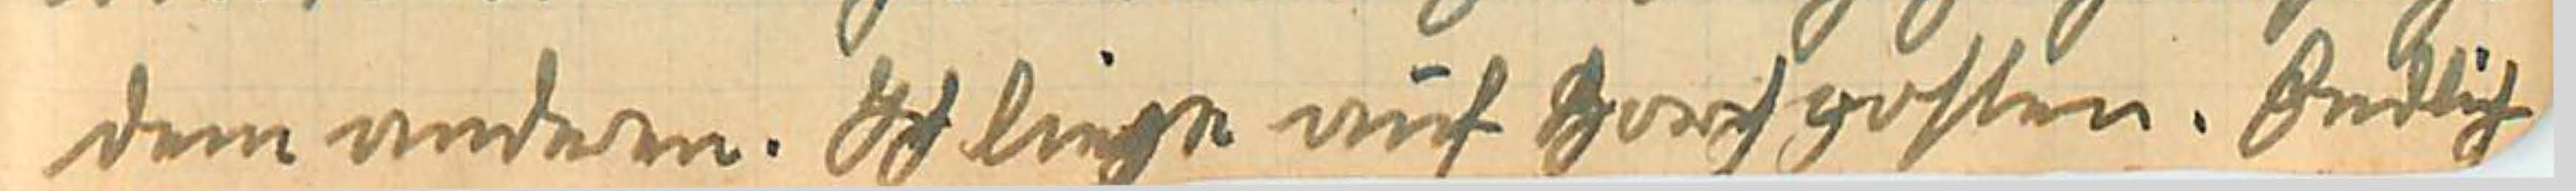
dem anderen. Ich liege auf Horchposten. Endlich
